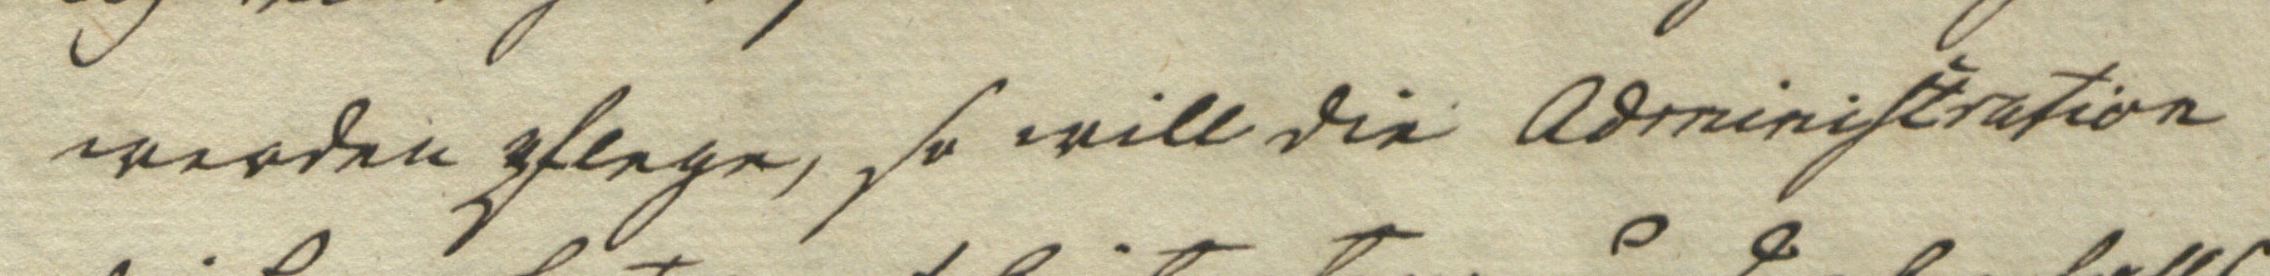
werden pflege, so will die Administration
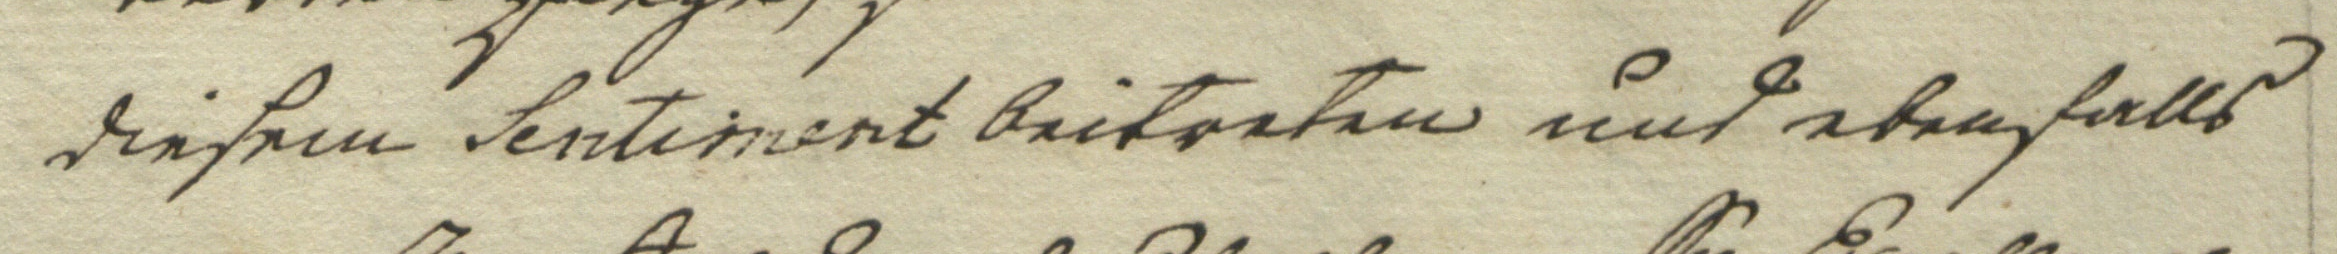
diesem Sentiment beitreten und ebenfalls
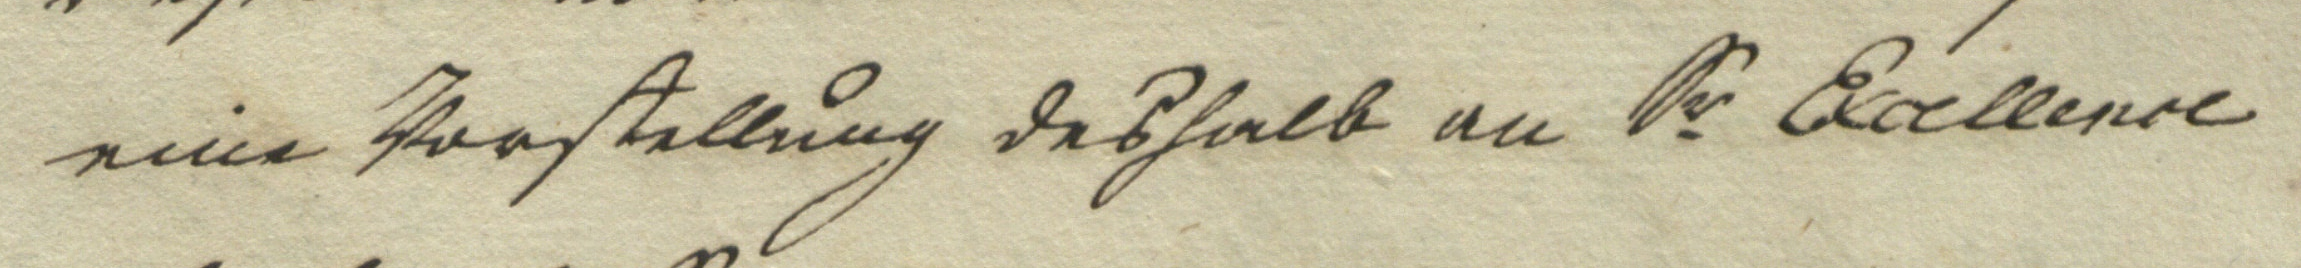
eine Vorstellung deshalb an Sr Excellence
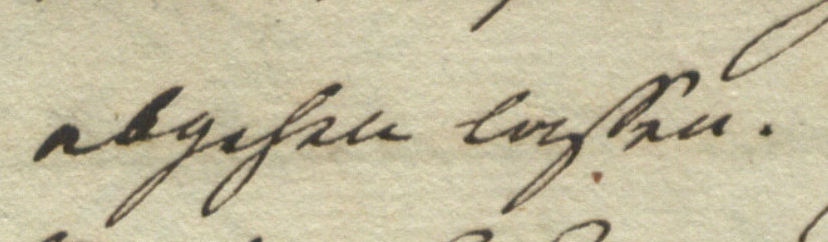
abgehen lassen.
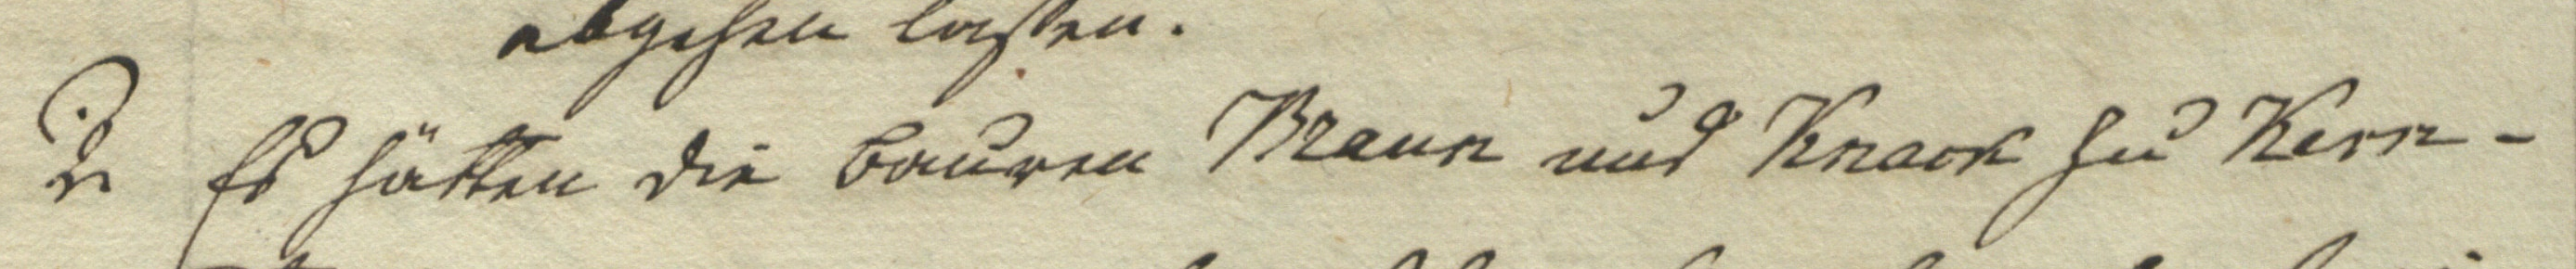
2. Es hätten die Bauren Braun und Knaack zu Kem¬
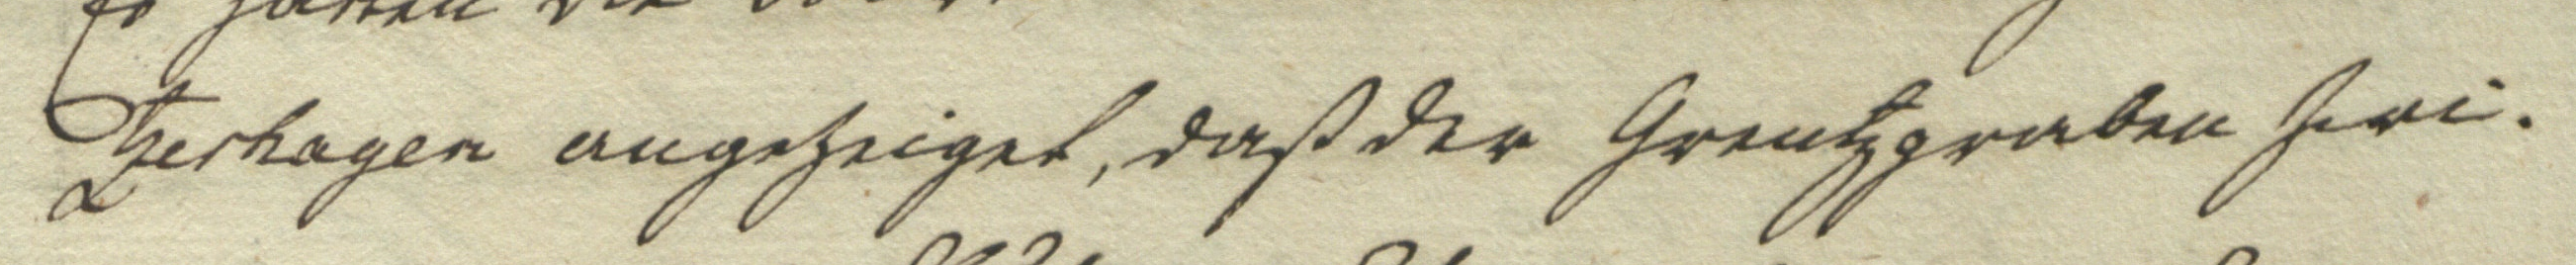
tzerhagen angezeiget, daß der Grentzgraben zwi¬
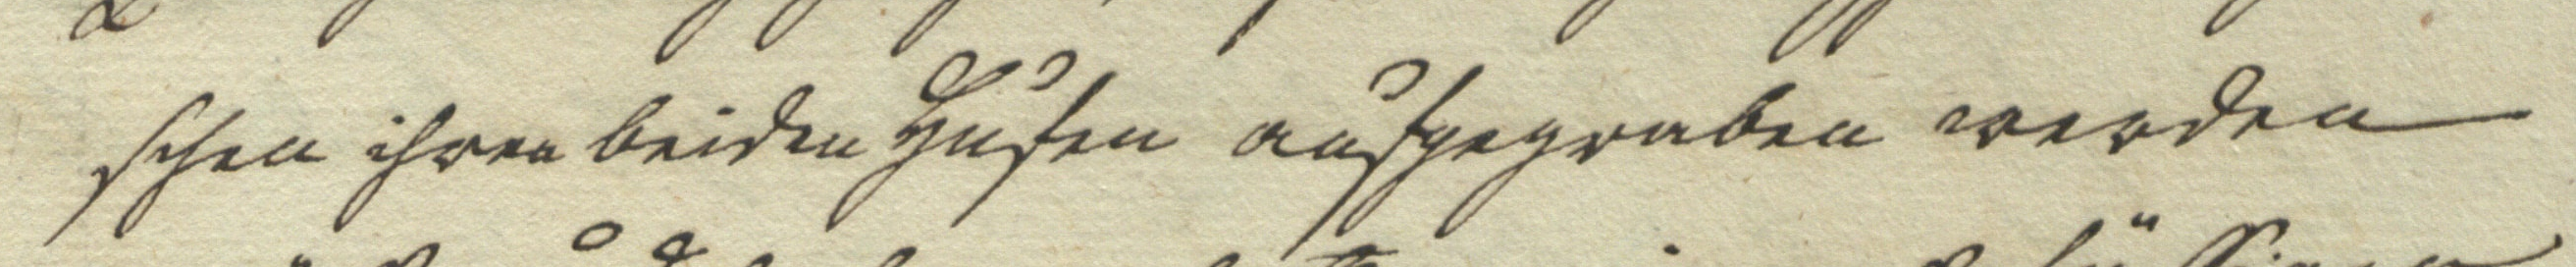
schon ihren beiden Hufen aufgegraben werden
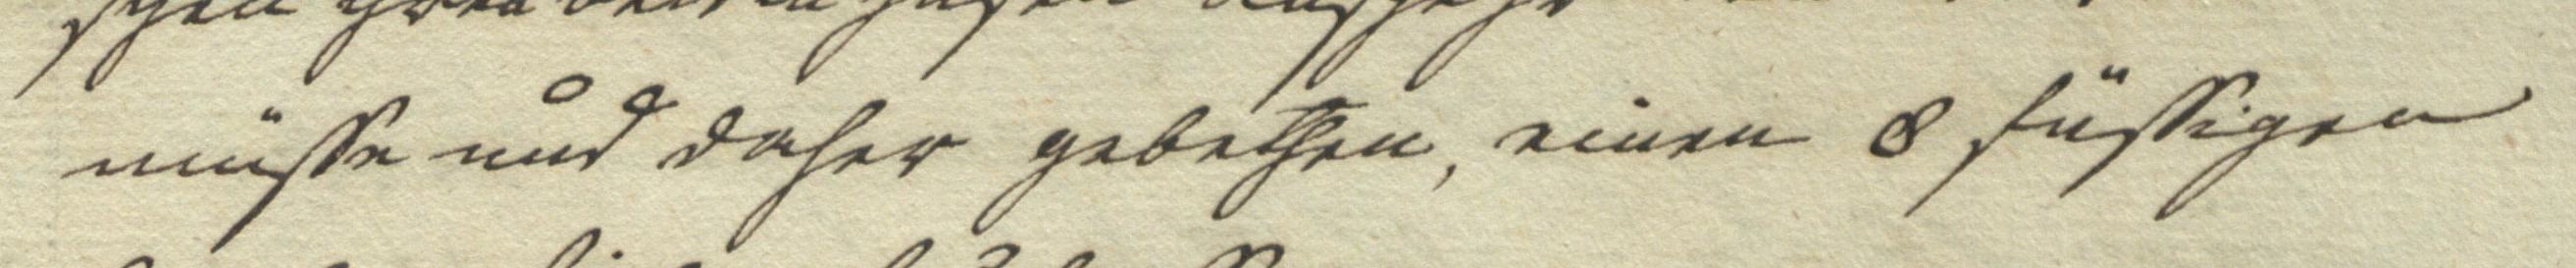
müsse und daher gebethen, einen 8 füßigen
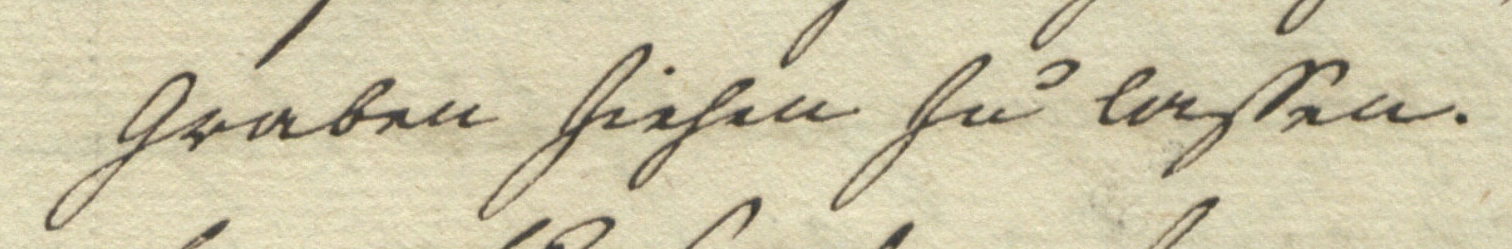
Graben ziehen zu lassen.
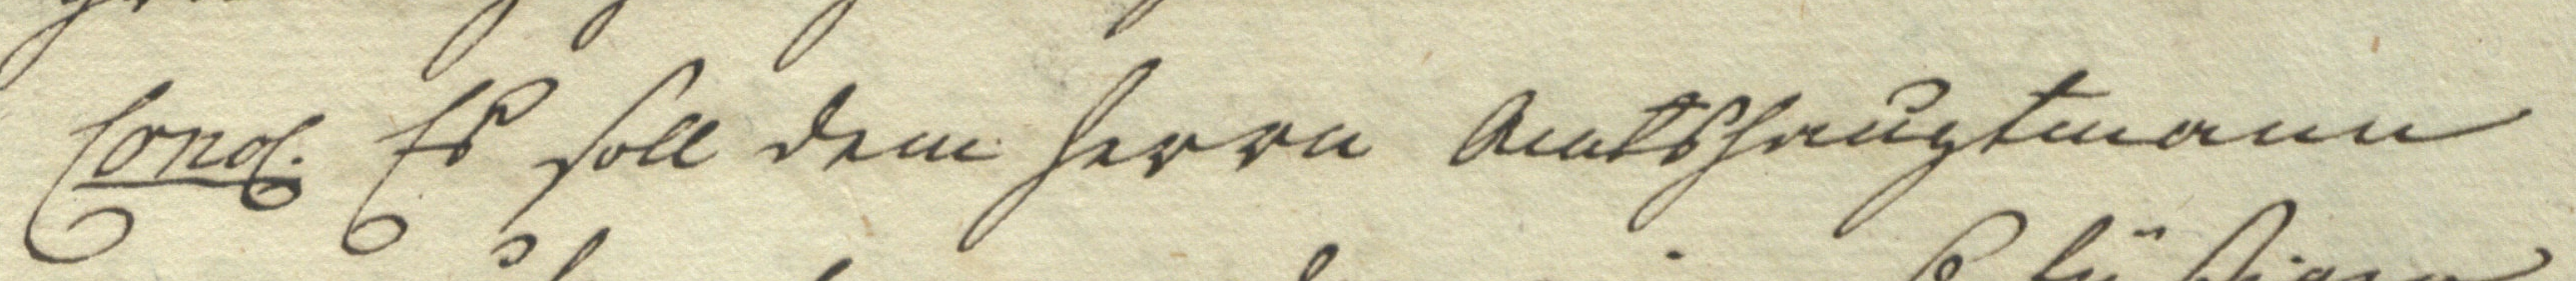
Concl. Es soll dem Herrn Amtshauptmann
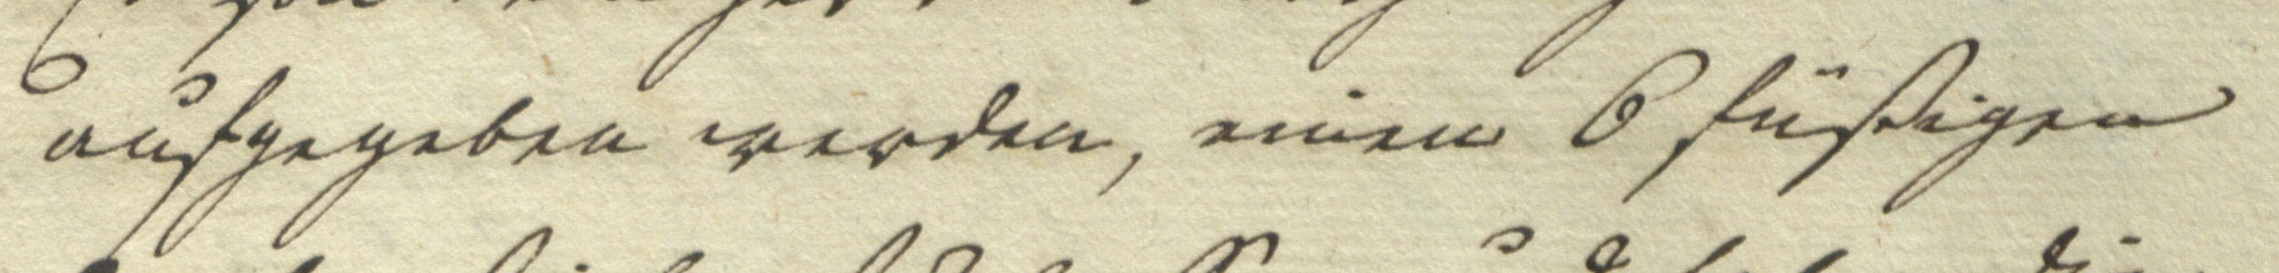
aufgegeben werden, einem 6 füßigen
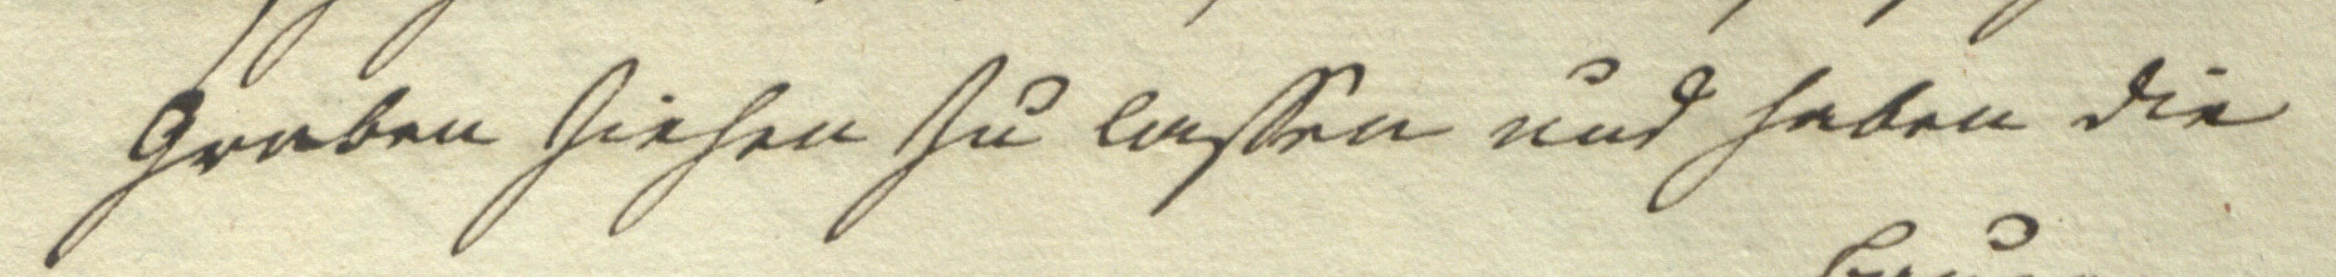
Graben ziehen zu lassen und haben die
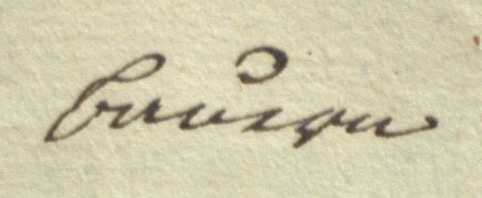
Bauern
